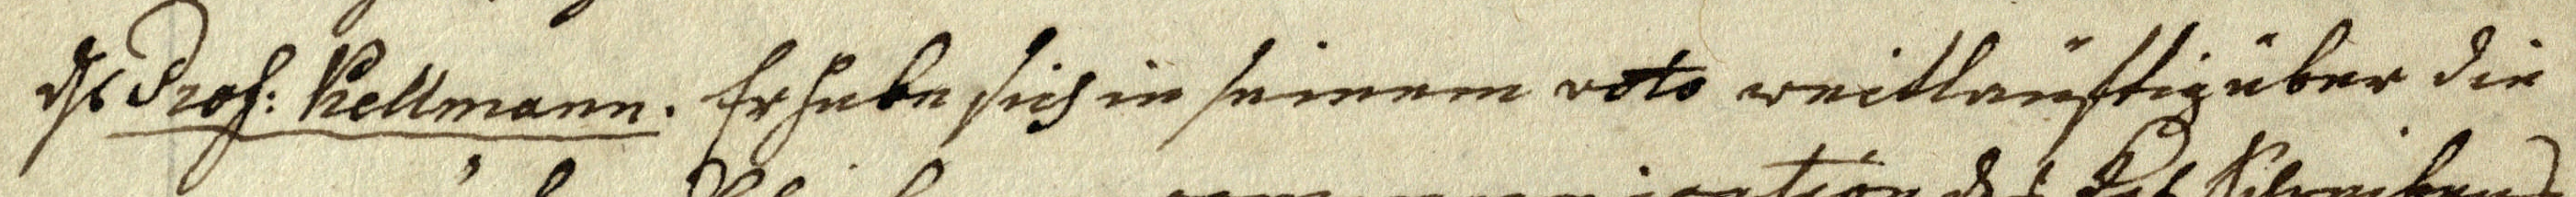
dh. Prof. Kellmann. Er habe sich in seinem voto weitläuftig über die
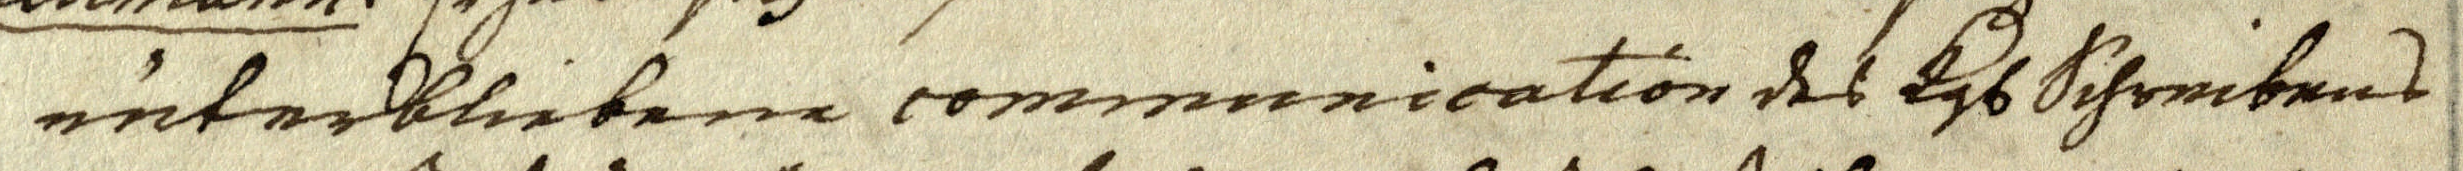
unterbliebene communication des Kgl. Schreibens
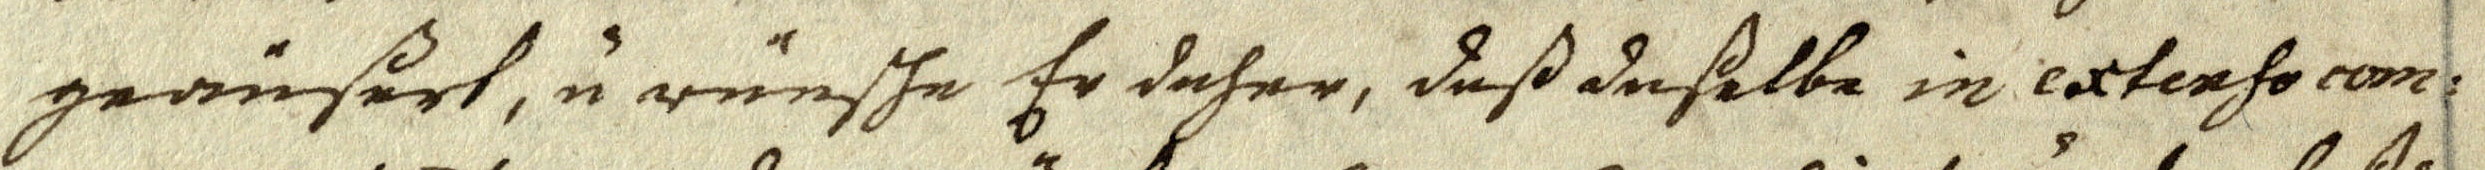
geäußert, u wünsche Er daher, daß daßelbe in extenso com¬
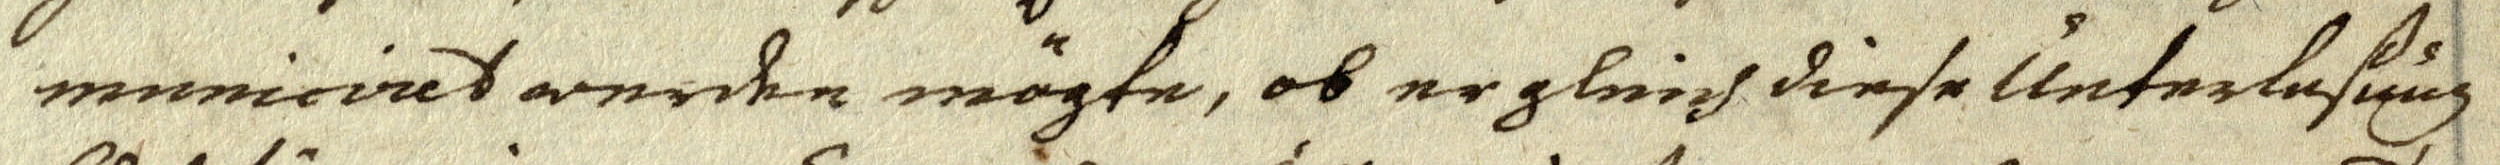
municiret werden mögte, ob er gleich diese Unterlaßung
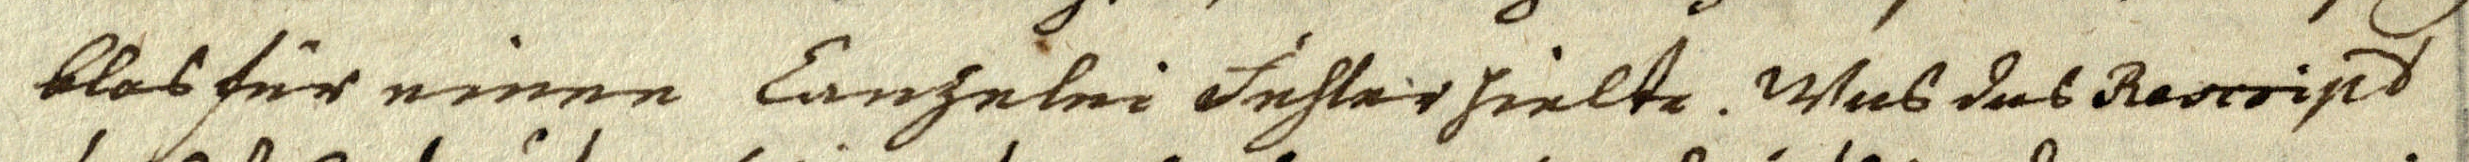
blos für einen Canzelei Fehler hielte. Was das Rescript
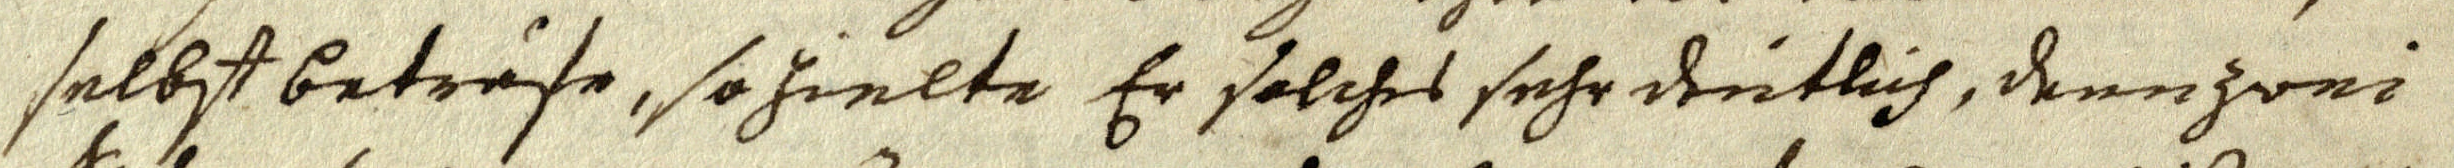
selbst beträfe, so hielte Er solches sehr deutlich, denn zwei
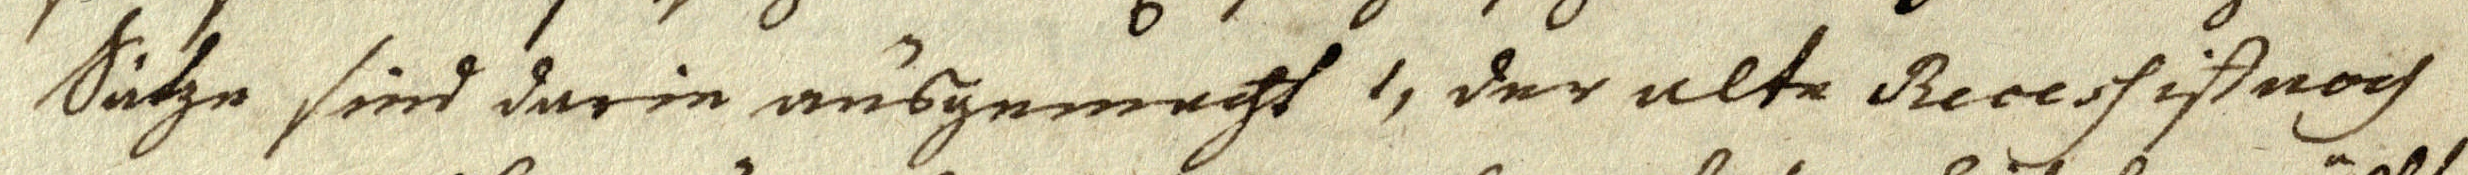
Sätze sind darin ausgemacht 1, der alte Recess ist noch
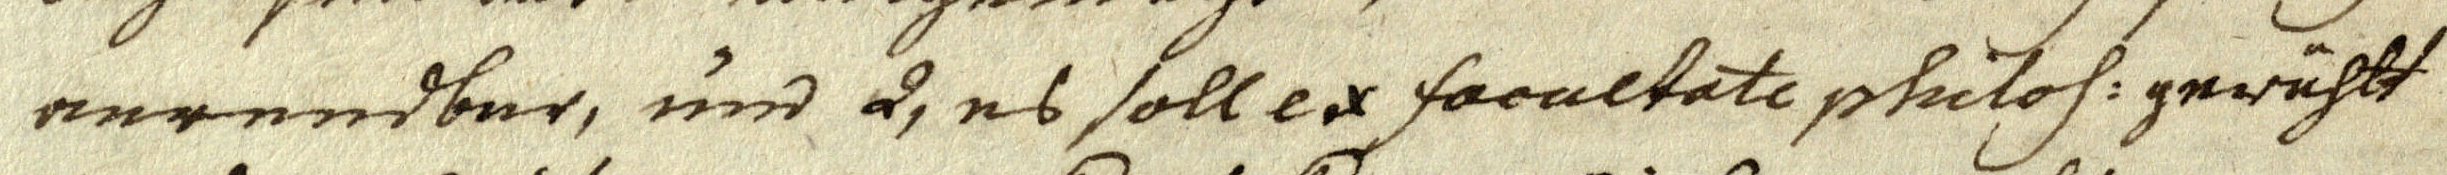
anwendbar, und 2, es soll ex facultate philos. gewählt
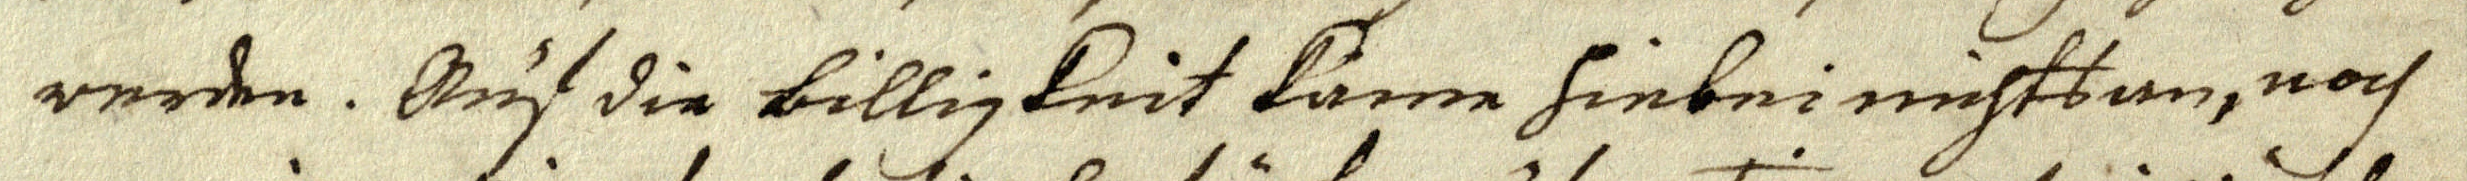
werden. Auf die Billigkeit käme hiebei nichts an, noch
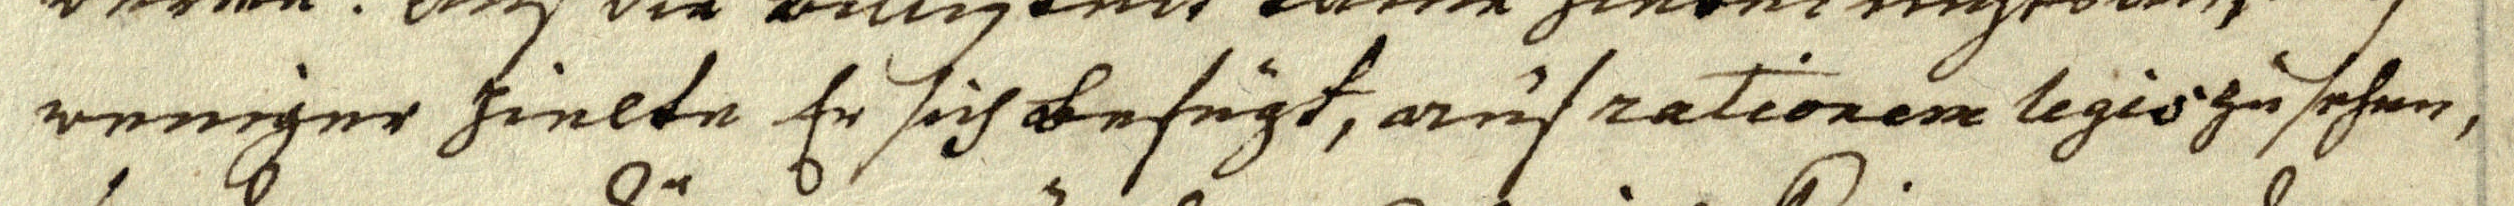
weniger hielte Er sich befugt, auf rationem legis zu sehen,
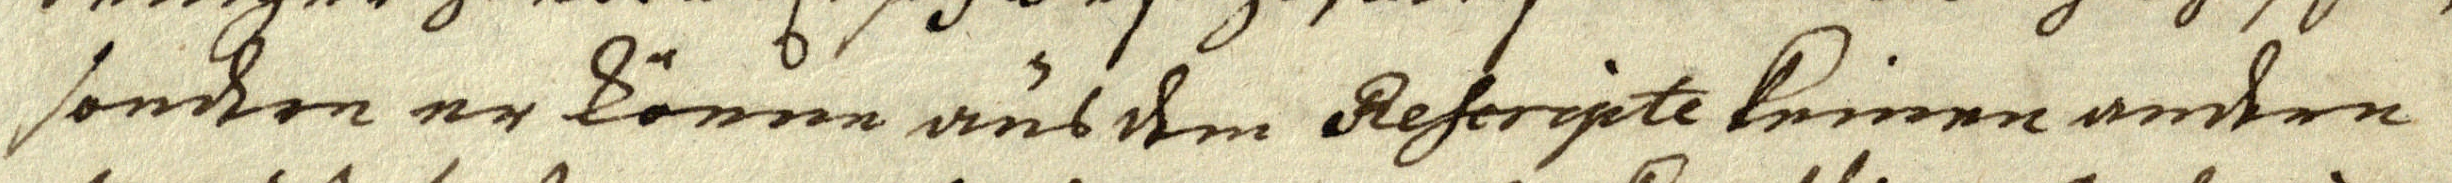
sondern er könne aus dem Rescripte keinen andern
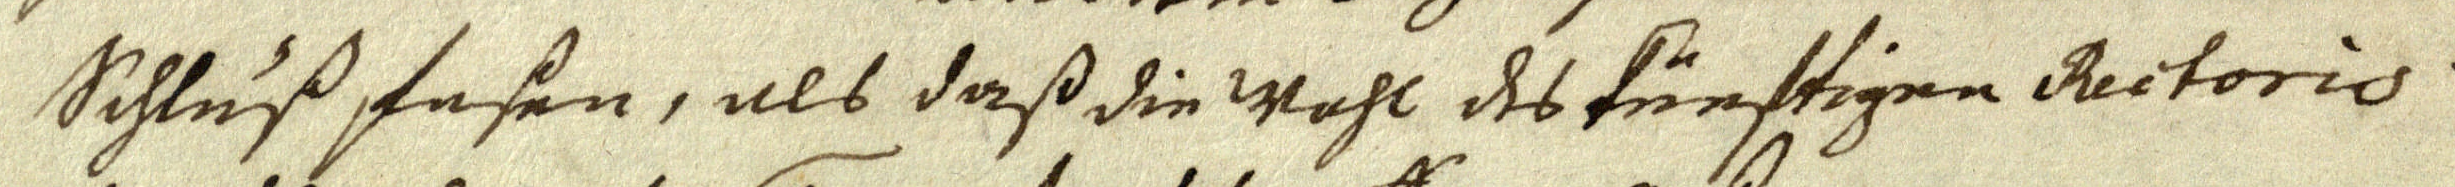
Schluß faßen, als daß die Wahl des künftigen Rectoris
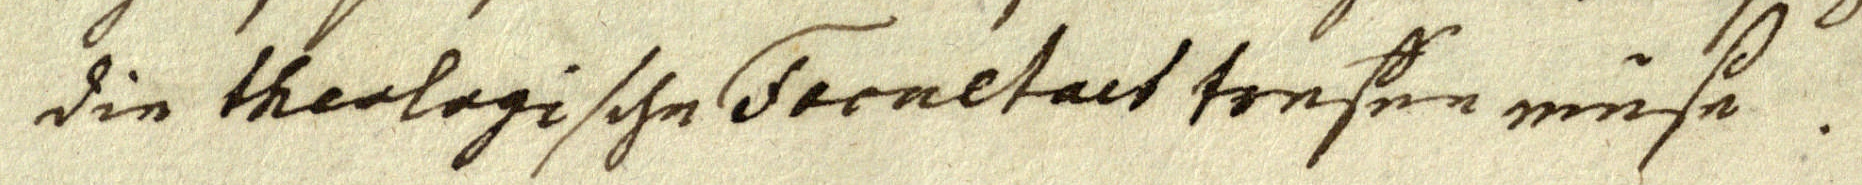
die theologische Facultaet treffen müße.
